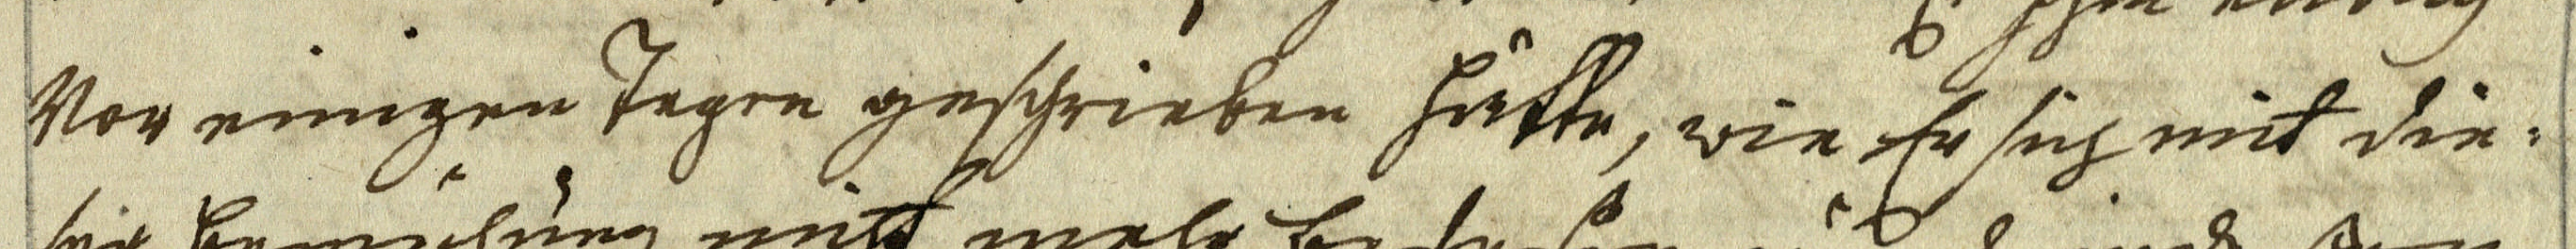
vor einigen Tagen geschrieben hätte, wie Er sich mit die¬
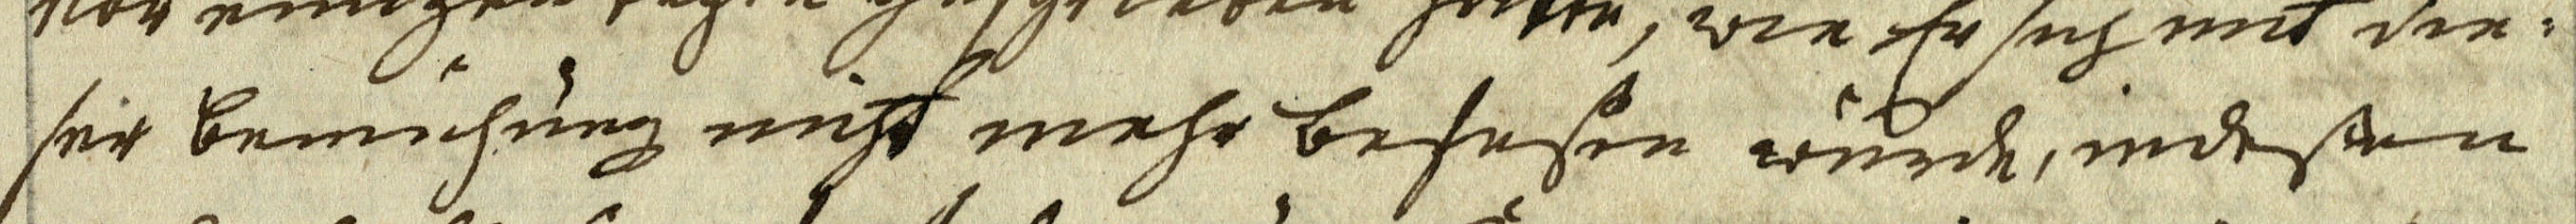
ser Bemühung nicht mehr befaßen würde, indeßen
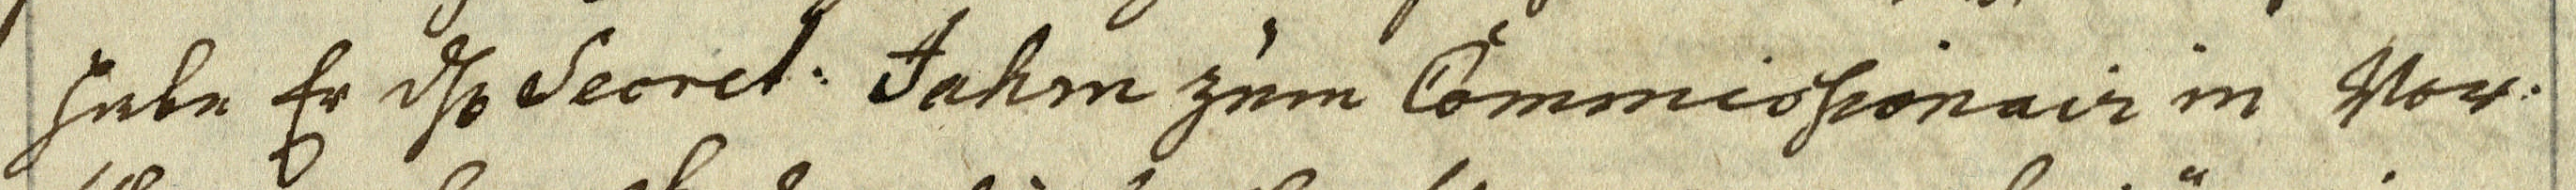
habe Er dh. Secret. Jahm zum Commissionair in Vor¬
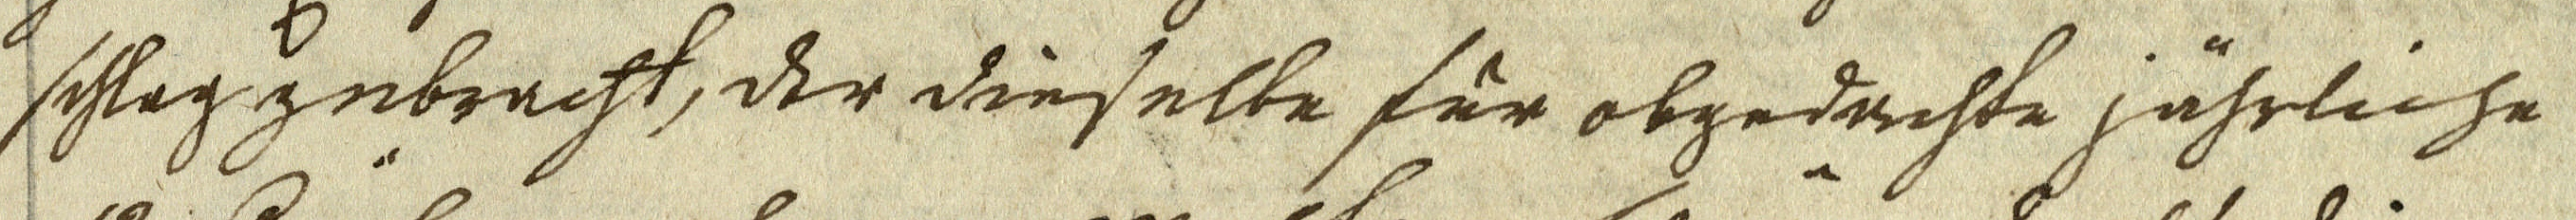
schlag gebracht, der dieselbe für obgedachte jährliche
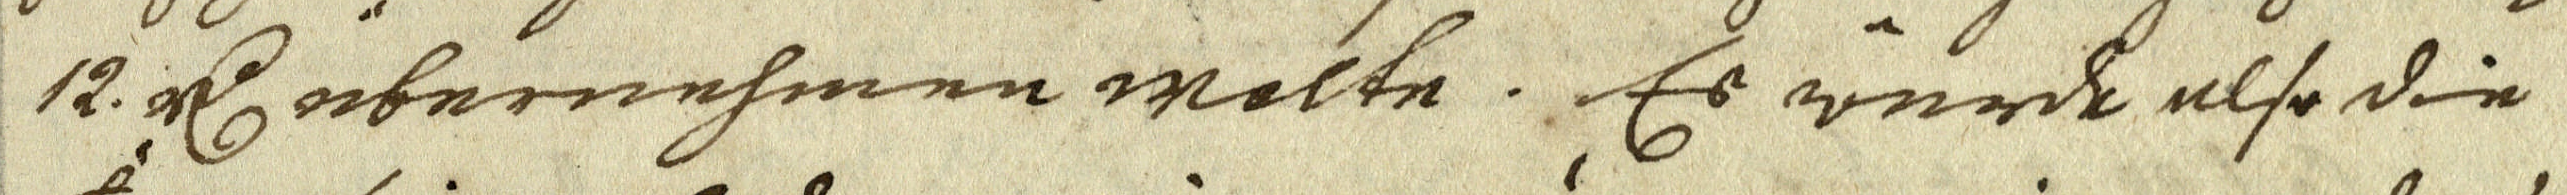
12. r. übernehmen wolte. Es würde also die
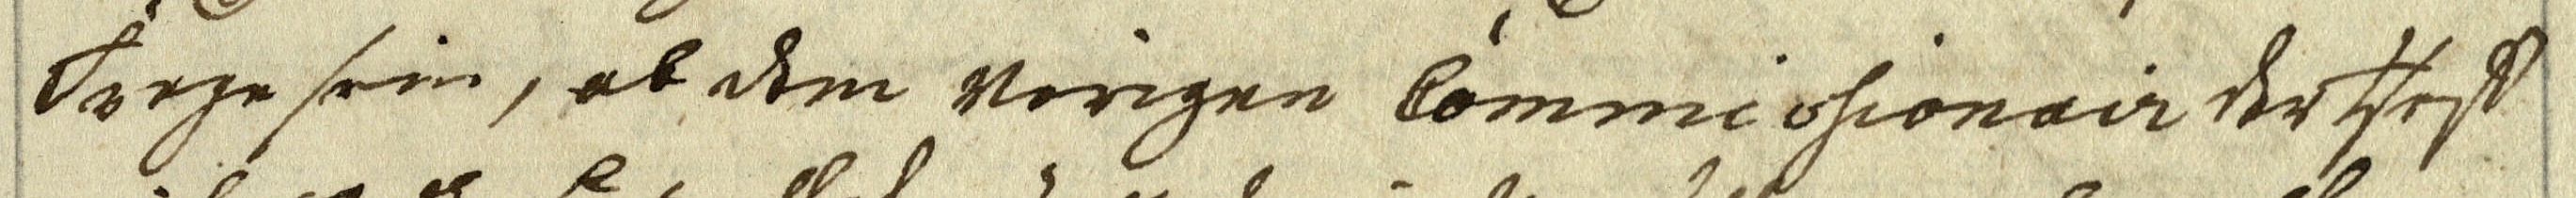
Frage sein, ob dem vorigen Commissionair der Rest
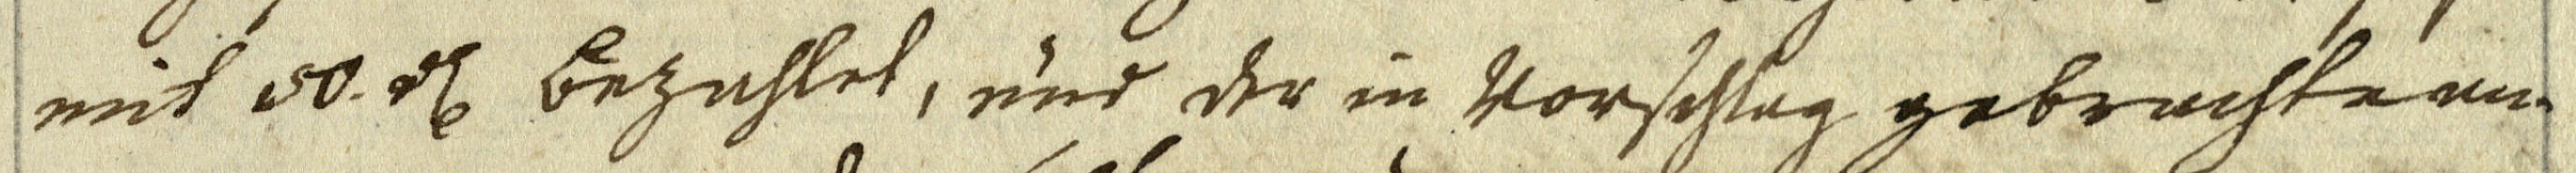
mit 50 r. bezahlet, und der in Vorschlag gebrachte an¬
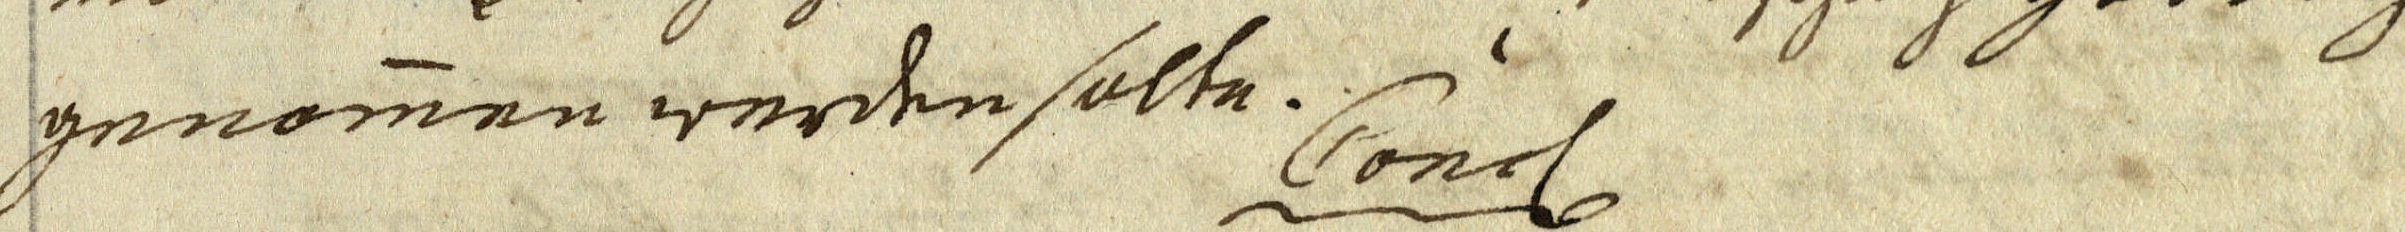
genomen werden solte.
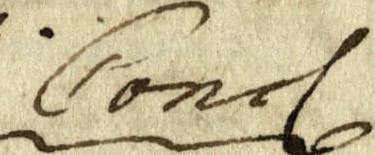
Concl.
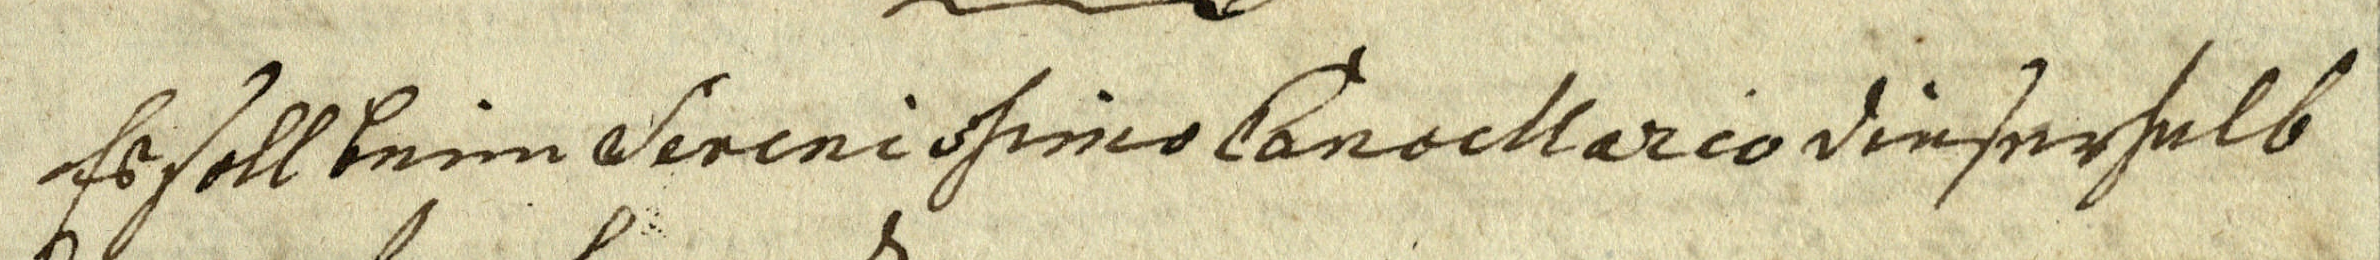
Es soll beim Serenissimo Cancellario dieserhalb
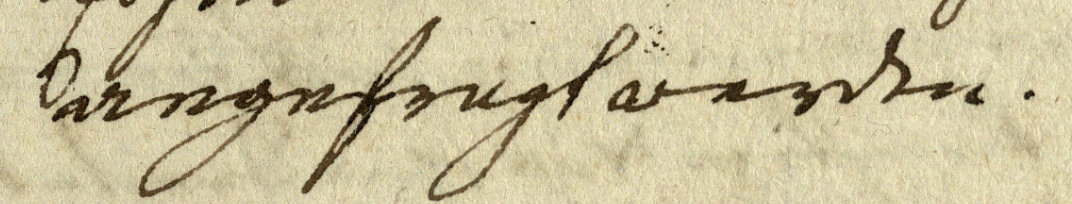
angefragt werden.
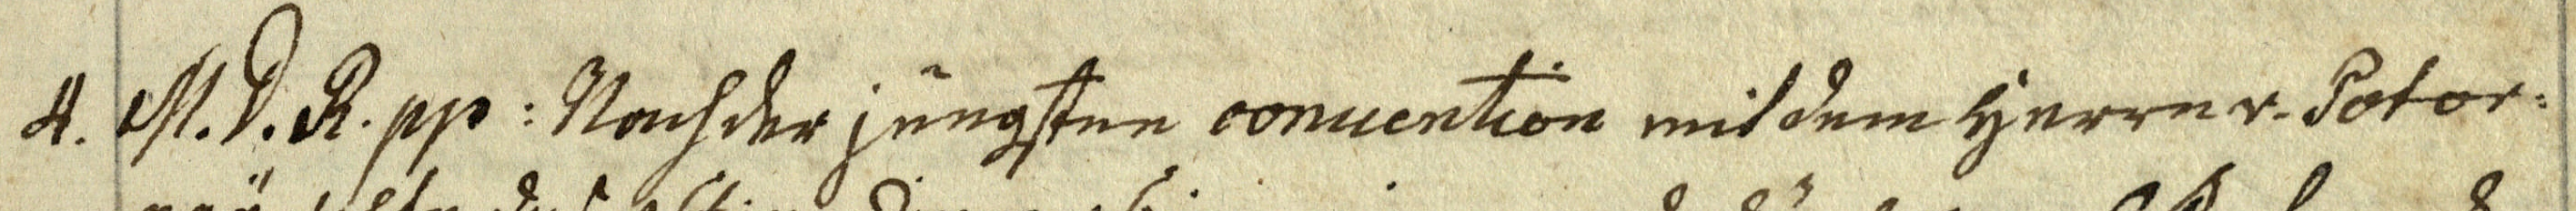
4. M. D. R. pp. Nach der jüngsten convention mit dem Herr v. Potor¬
